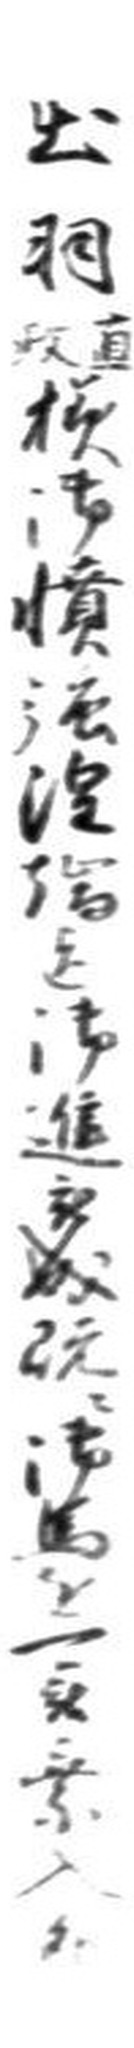政様御憤強湟端迄御進被成既ニ御馬を可被乗入処
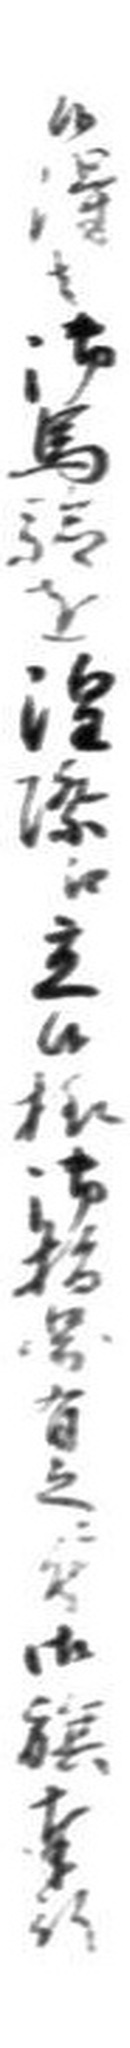候得者御馬験を湟際江立候様御指図有之ニ付御旗奉行
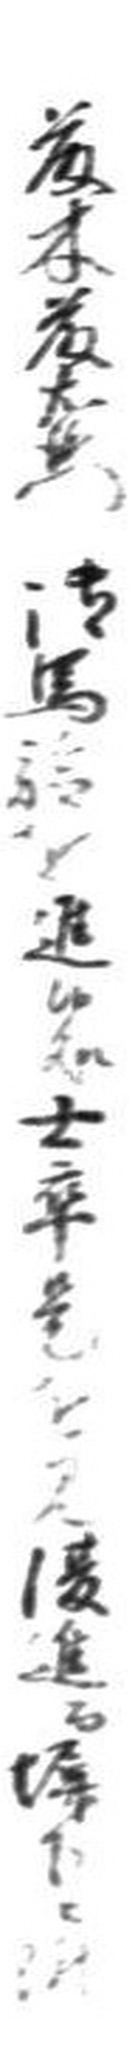藤木藤左衛門御馬験を進候処士卒是を見復進而塀下ニ附
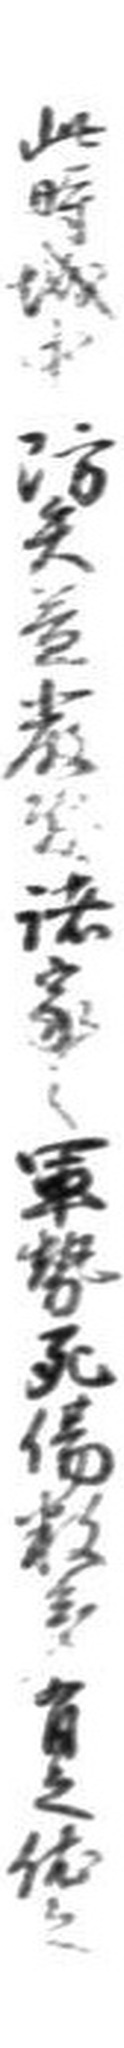此時城中防矢益厳敷諸家之軍勢死傷数多有之依之
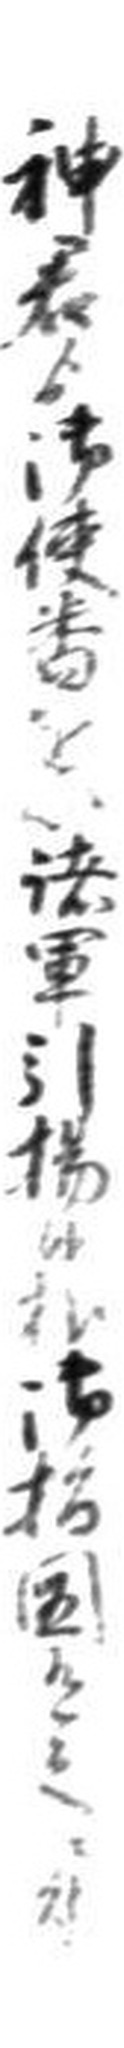神君ゟ御使番を以諸軍引揚候様御指図有之ニ付
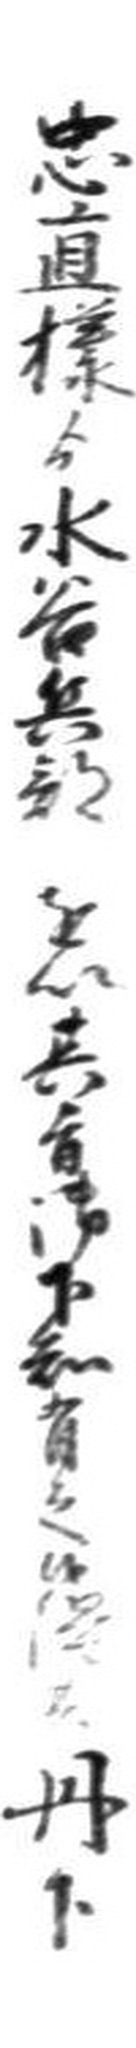忠直様水谷兵部を以其旨御下知有之候得共丹下

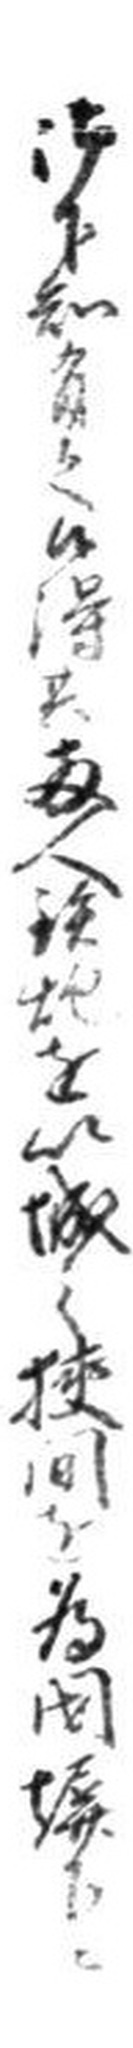御下知有之候得共両人鉄炮を以城之挟間を為閉塀下ニ
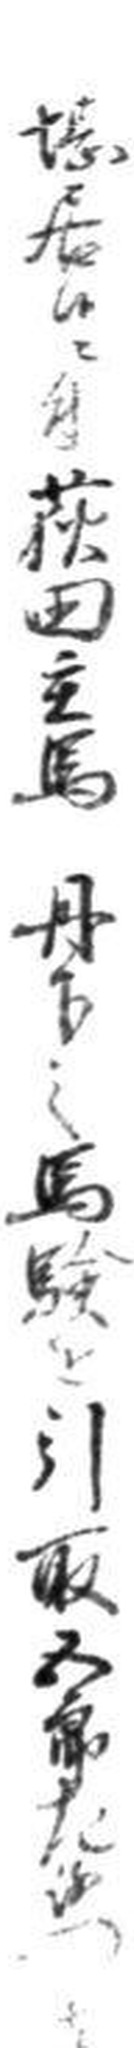堪居候ニ付荻田主馬丹下之馬験を引取五郎左衛門者
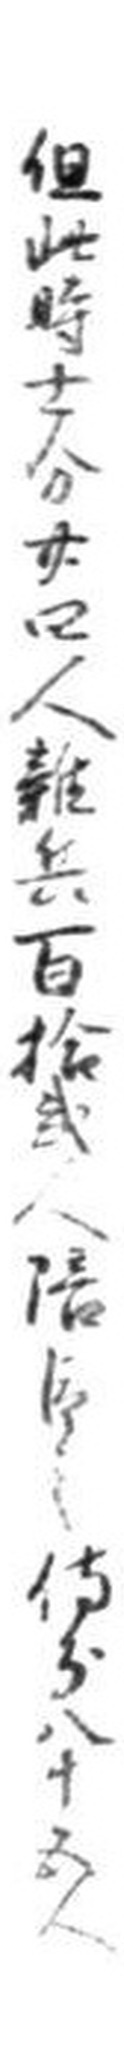但此時士分廿四人雑兵百拾弐人陪臣之侍分八十五人
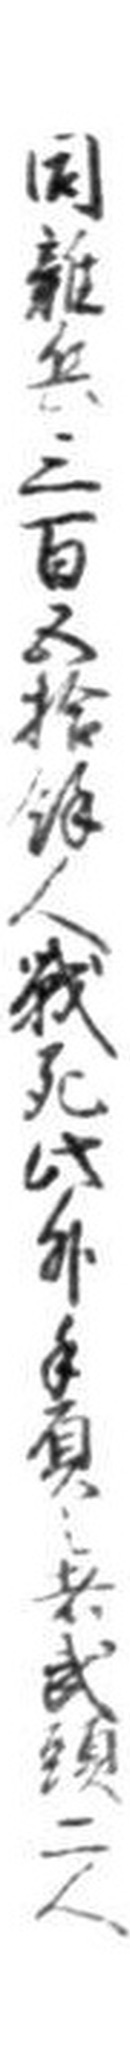同雑兵三百五拾余人戦死此外手負之者武頭二人
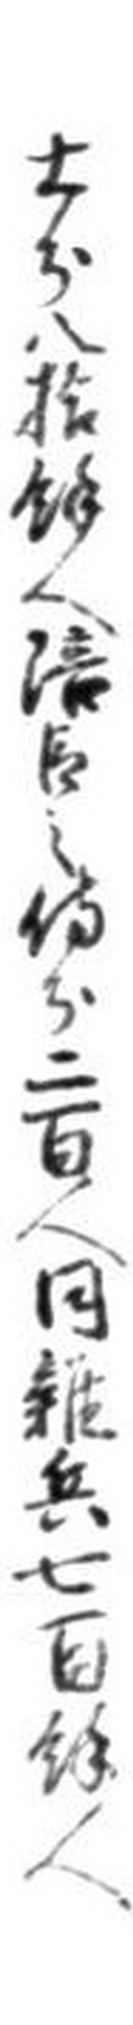士分八拾余人陪臣之侍分二百人同雑兵七百余人
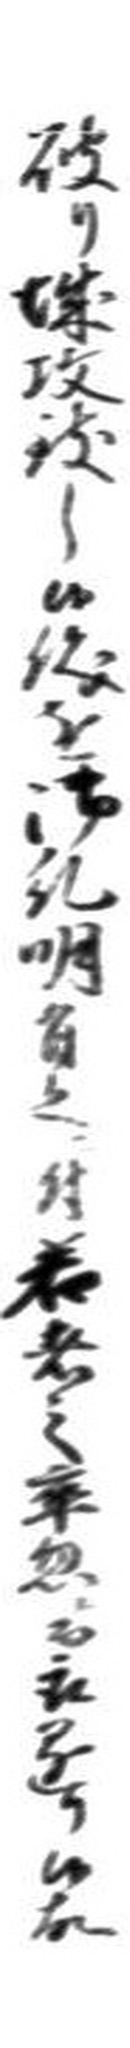破り城攻致し候儀を御糺明有之ニ付若者之卒忽ニ而取懸り候故
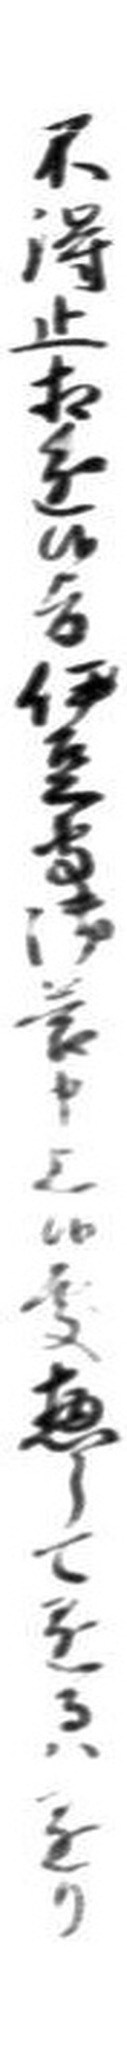不得止相進候旨伊豆守御答申上候処惣して懸るハ懸り
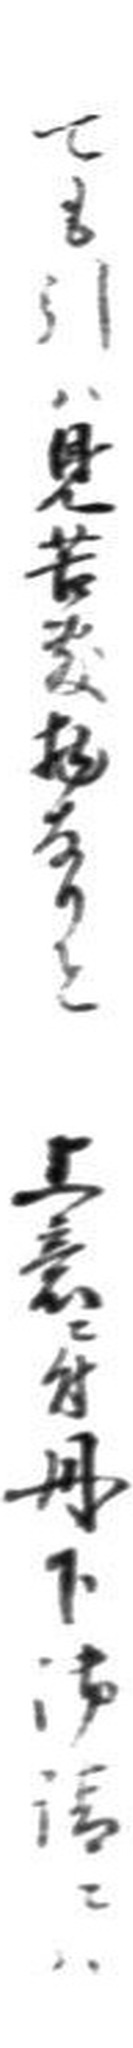ても引ハ見苦敷物なりと上意ニ付丹下御請ニハ
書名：家譜 二 忠直公 従文禄四年到慶安四年
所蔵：福井県文書館 Fukui Prefectural Archives
